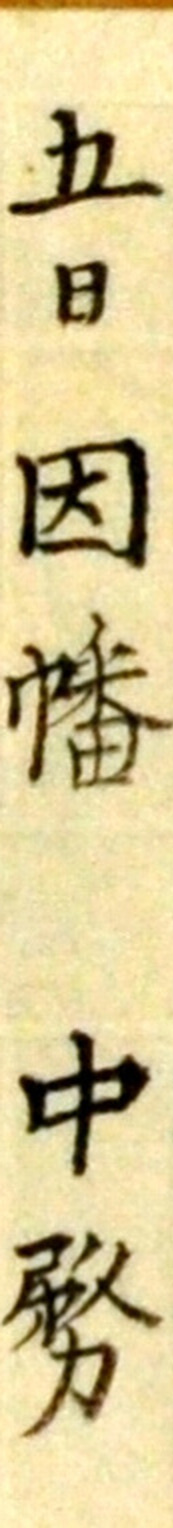五日因幡中務
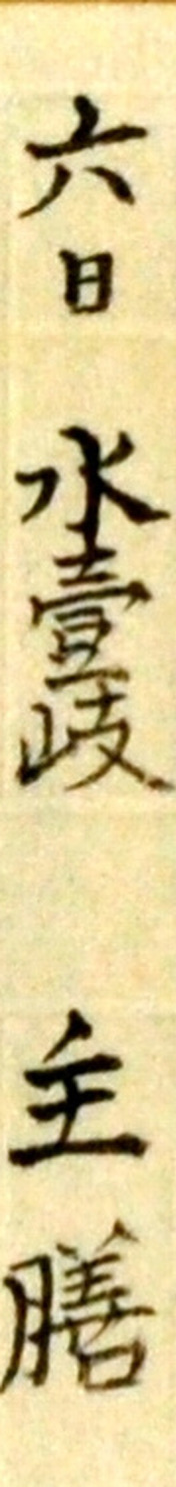六日水壱岐主膳
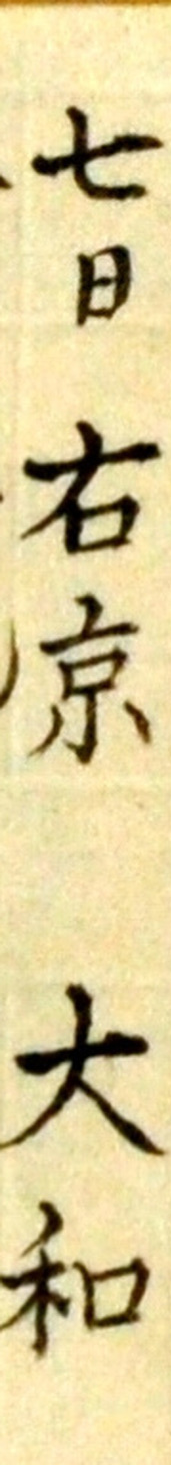七日右京大和
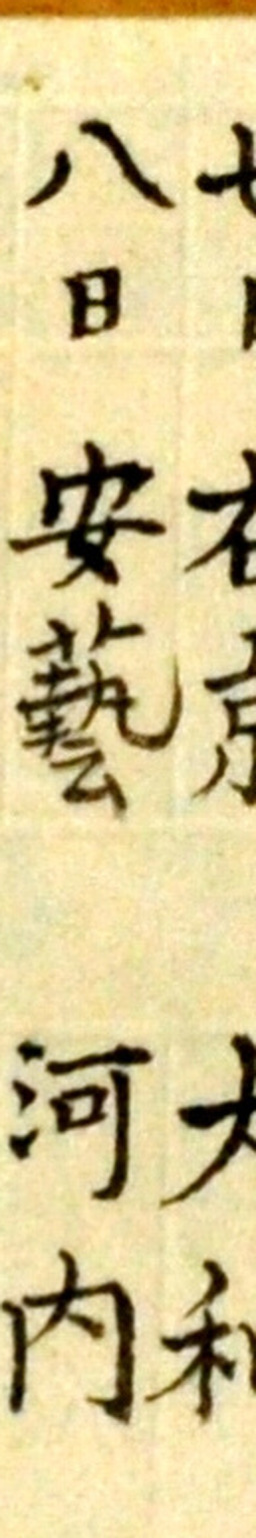八日安芸河内
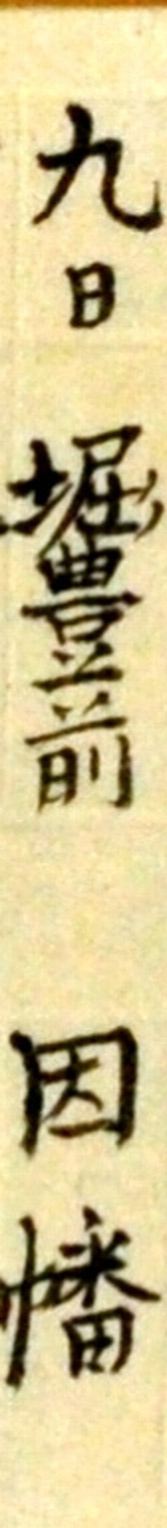九日堀豊前因幡
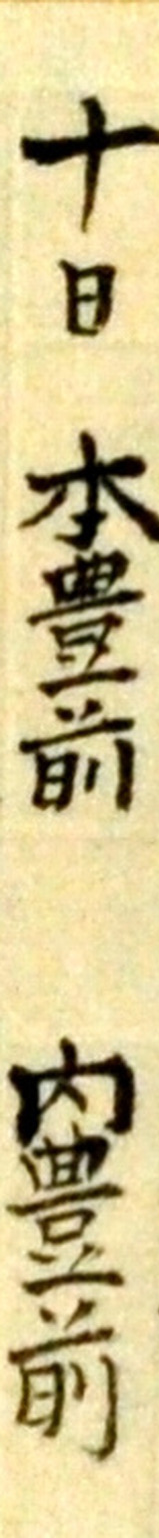十日本豊前内豊前
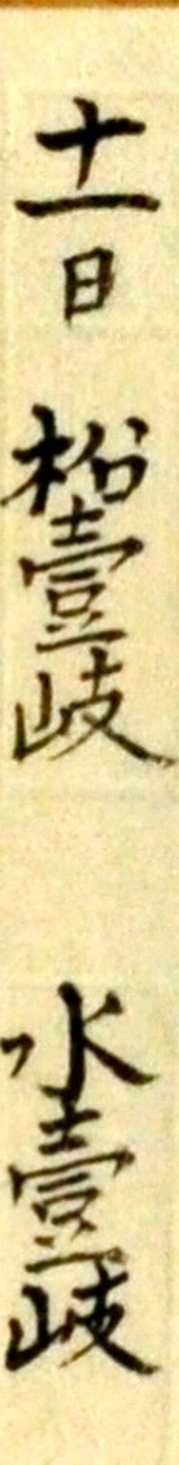十一日松壱岐水壱岐
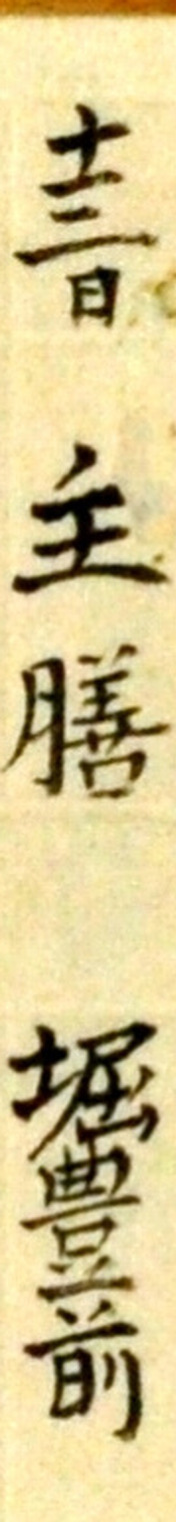十三日主膳堀豊前
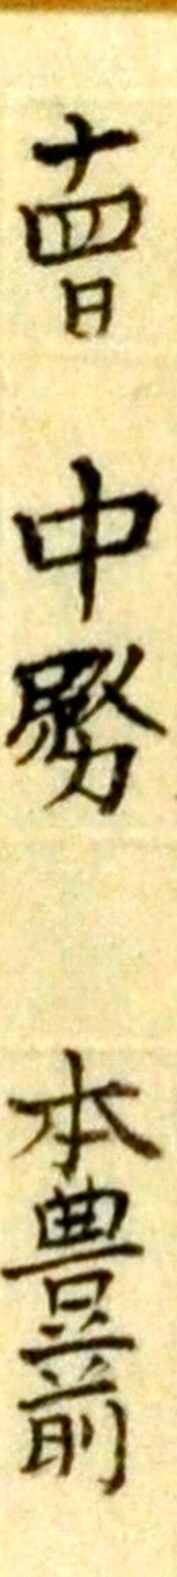十四日中務本豊前
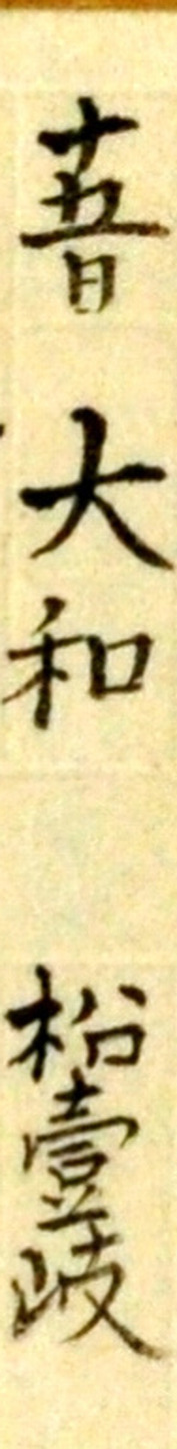十五日大和松壱岐
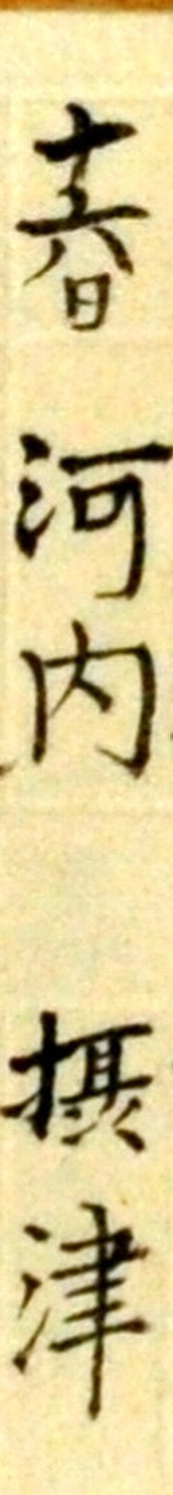十六日河内摂津
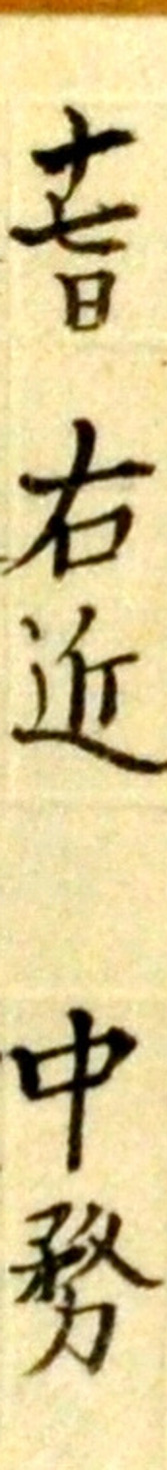十七日右近中務
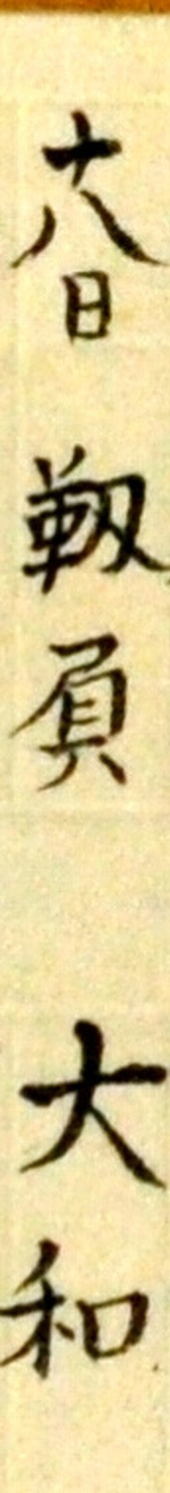十八日靱負大和
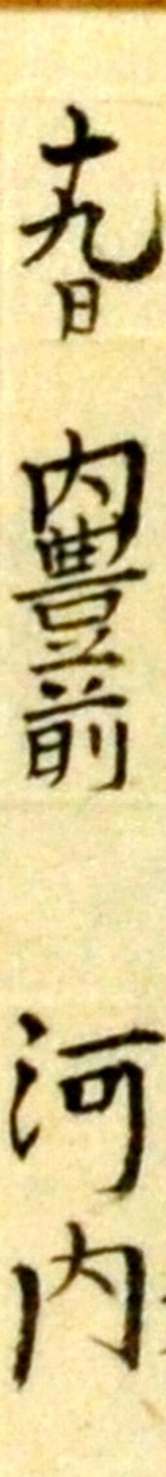十九日内豊前河内
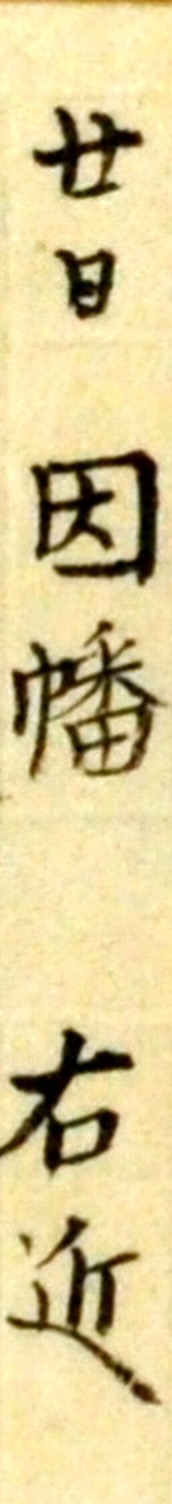廿日因幡右近
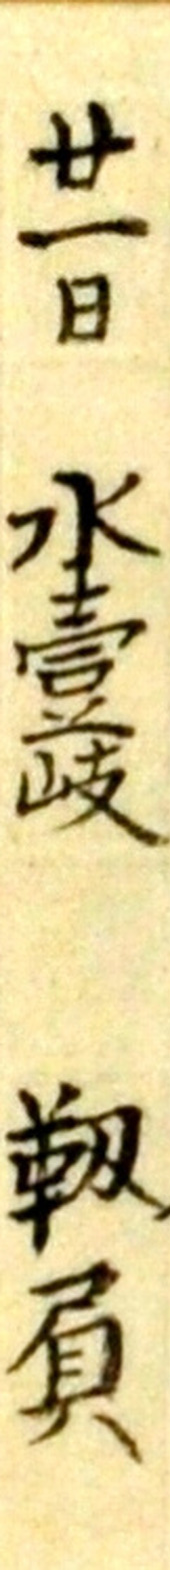廿一日水壱岐靱負
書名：六月・八月詰日一覧
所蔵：伊那市立高遠町図書館・合同会社AMANE
